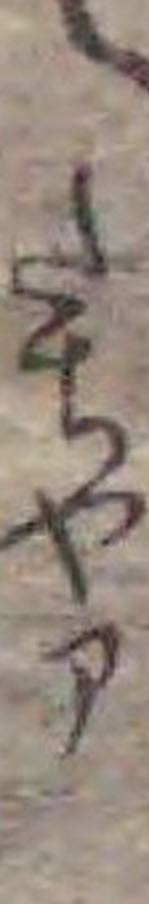たちやァ
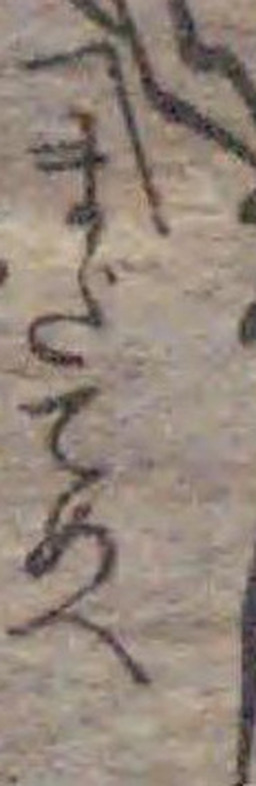〽まだてめへ
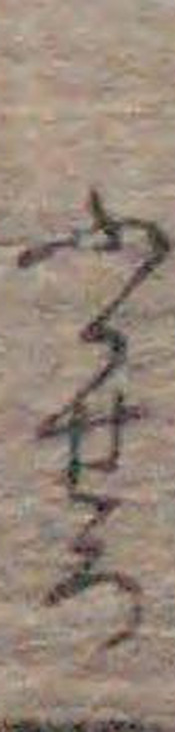ふかせろ
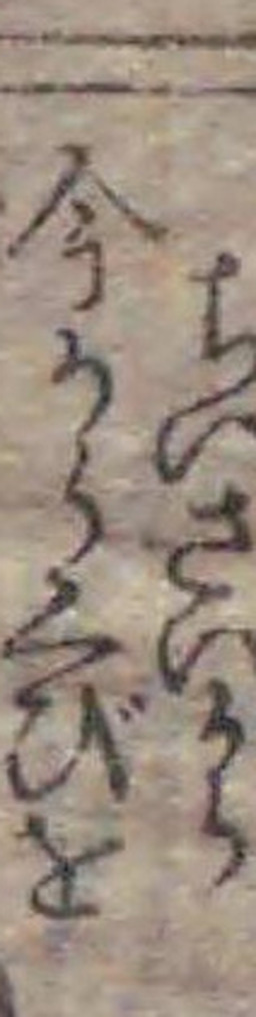今からくびを
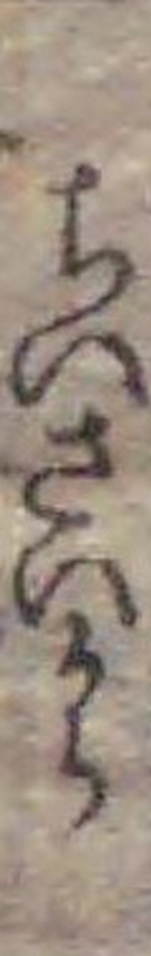ちいさいから
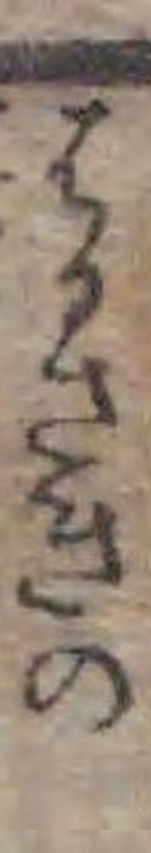はるさきの
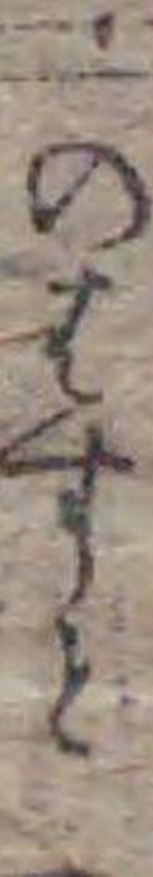のはすと
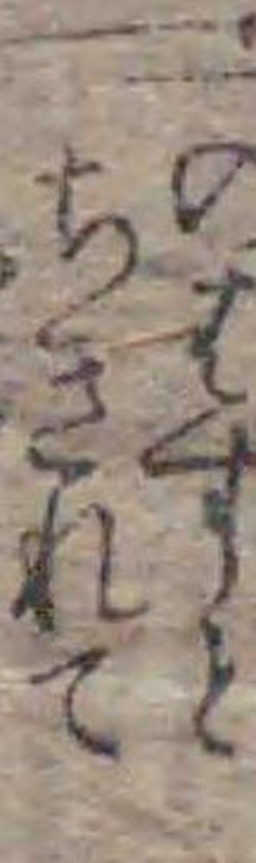ちきれて
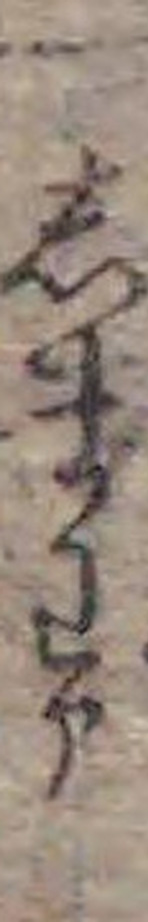しまわァ
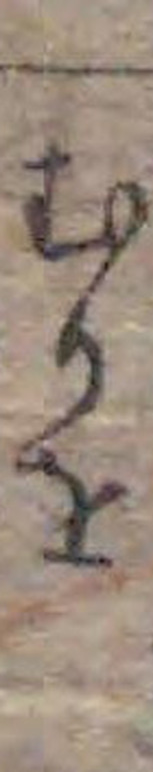むりを
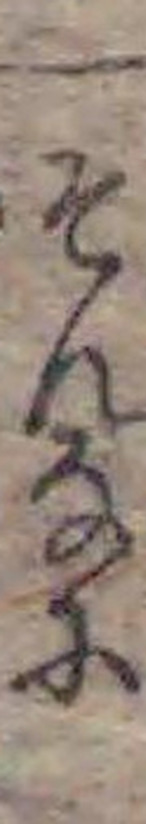そんなに
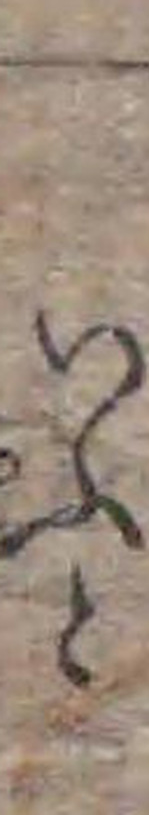いふと
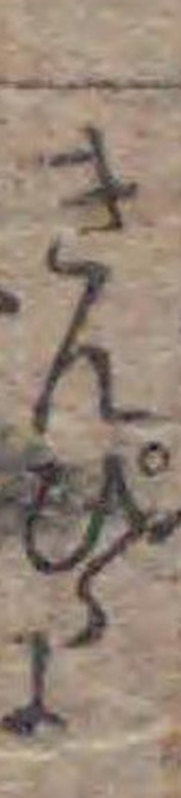きんぴらに
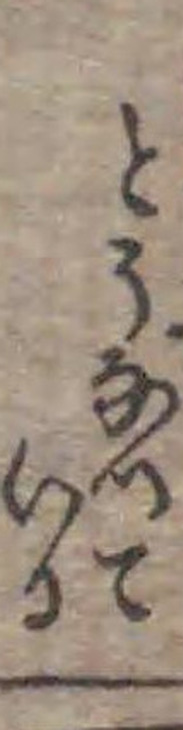とうなつて
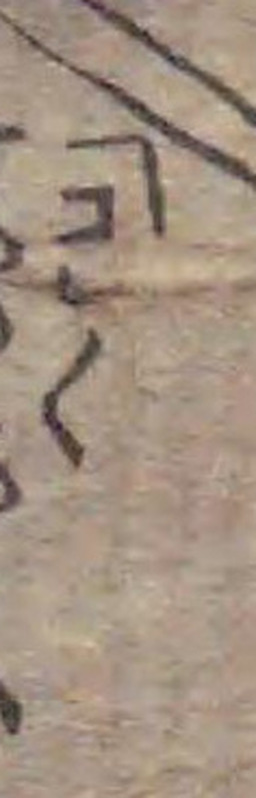〽これ〳〵
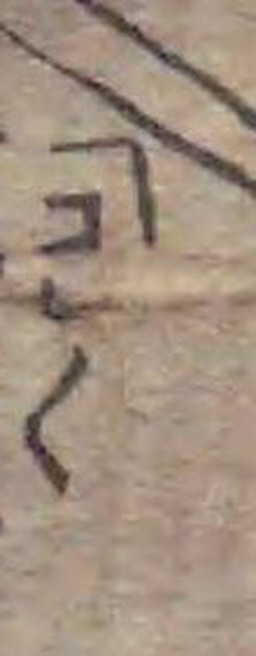〽これ〳〵
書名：年中行状記 : 2巻
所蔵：国立国会図書館 National Diet Library, JAPAN
